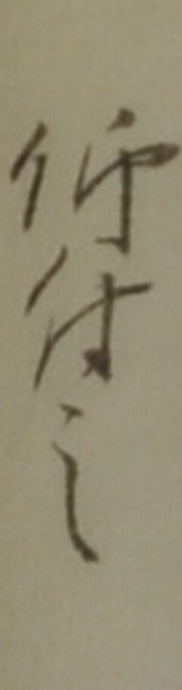仰付之
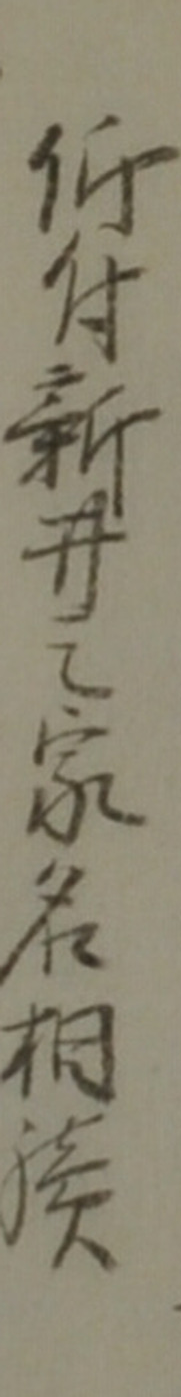仰付新井之家名相続
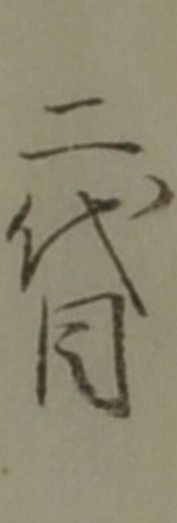二代目
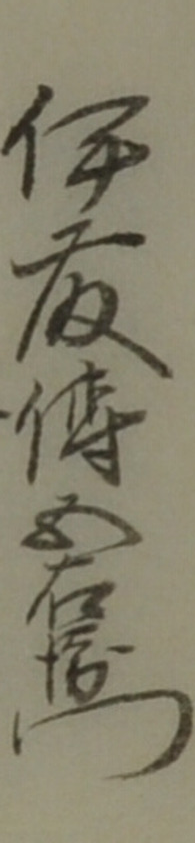伊藤伝五右衛門
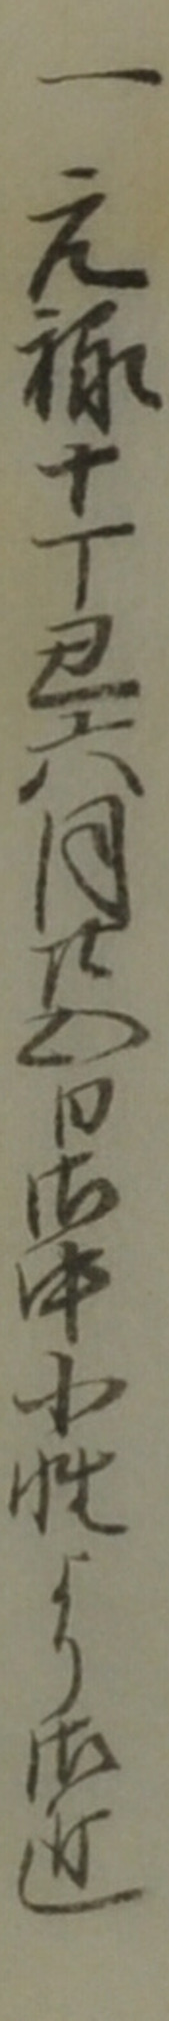一元禄十丁丑六月廿五日御中小性より御近
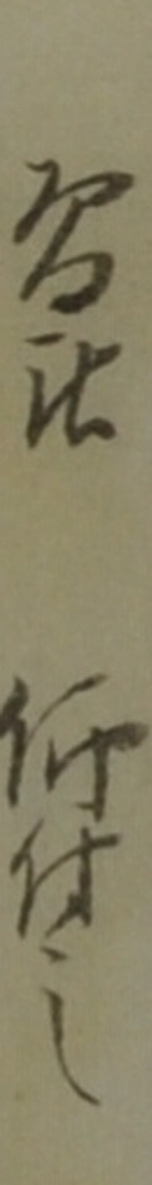習被仰付之
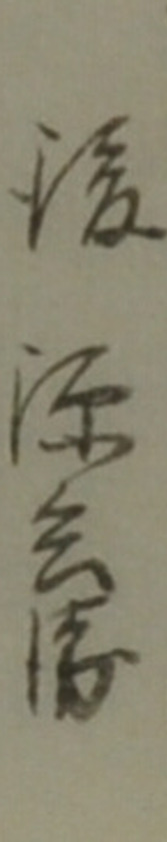後源兵衛
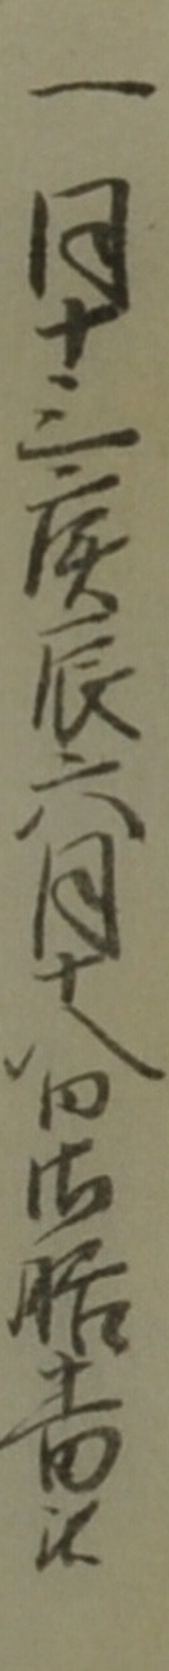一同十三庚辰六月十八日御膳番被
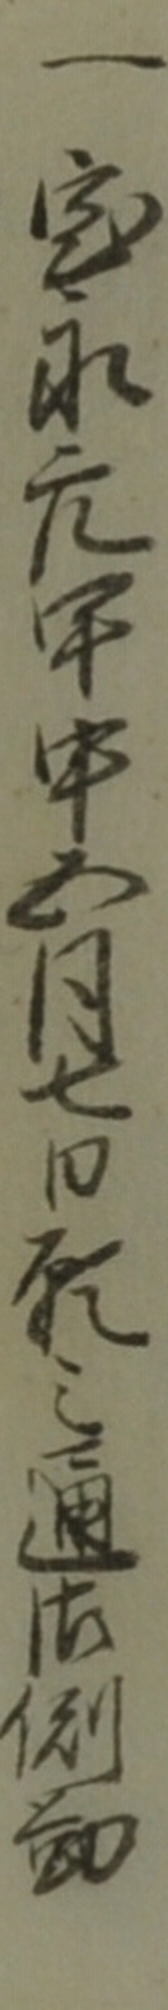一宝永元甲申年五月七日願之通御側勤
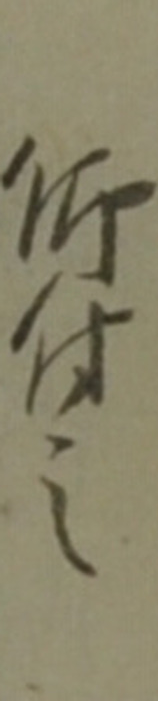仰付之
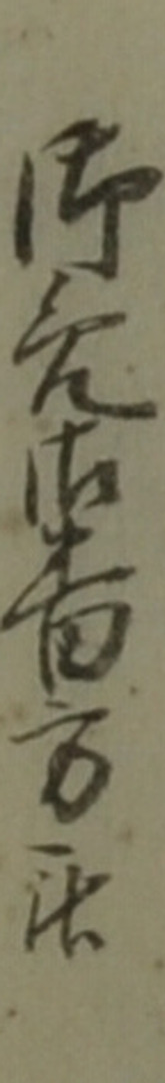御免御番方被
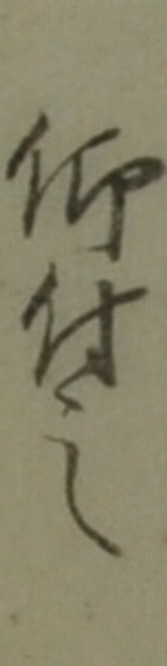仰付之
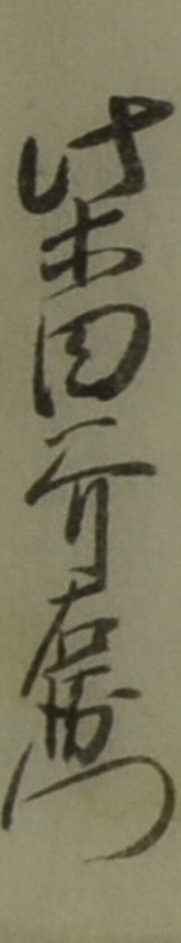柴田斧右衛門
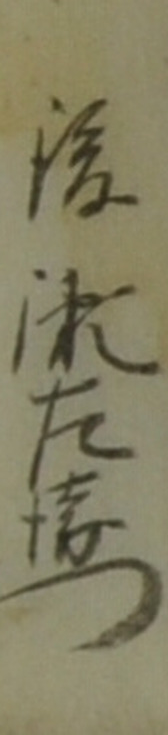後瀬左衛門
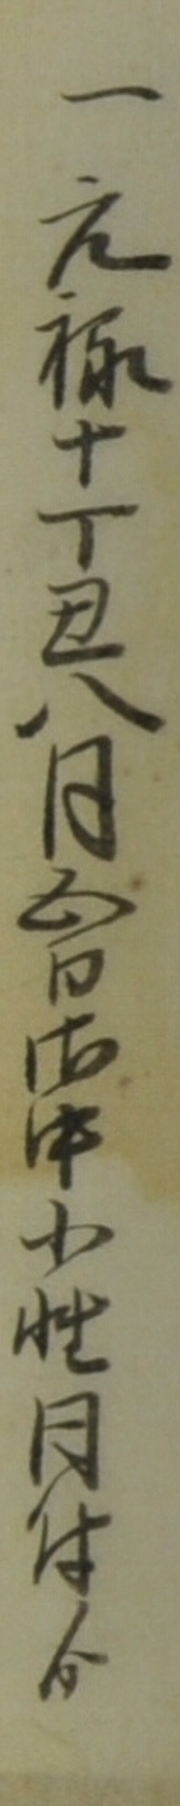一元禄十丁丑年八月五日御中小性目付ゟ

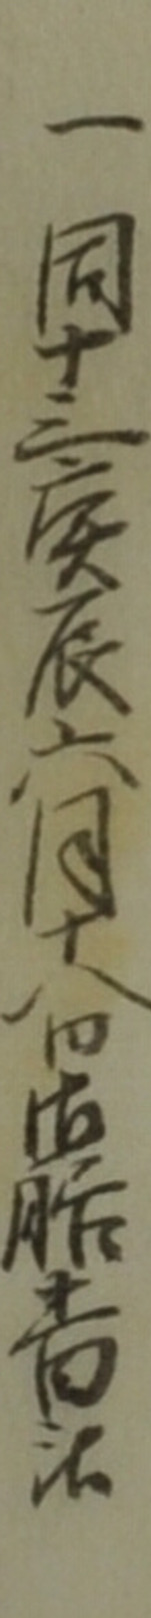一同十三庚辰六月十八日御膳番被
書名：諸御役代々録（五）
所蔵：伊那市立高遠町図書館・合同会社AMANE
